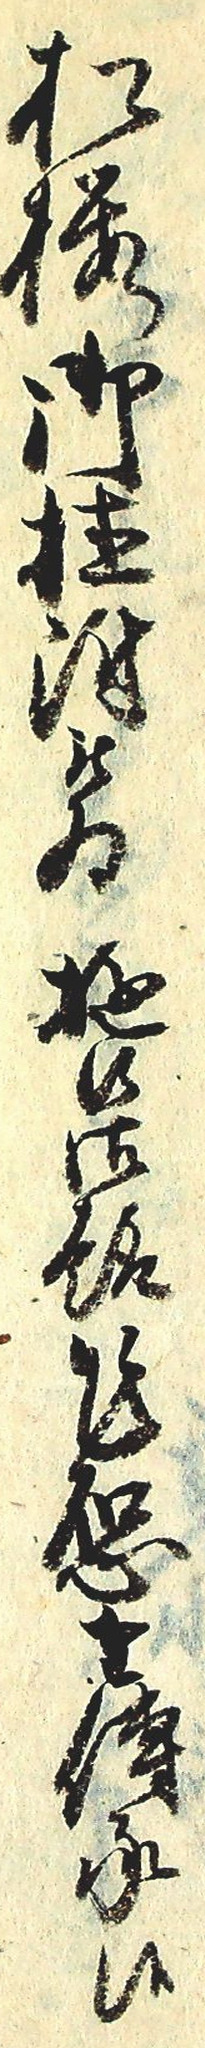松桜御植附被為遊候御趣乍恐奉伝承候
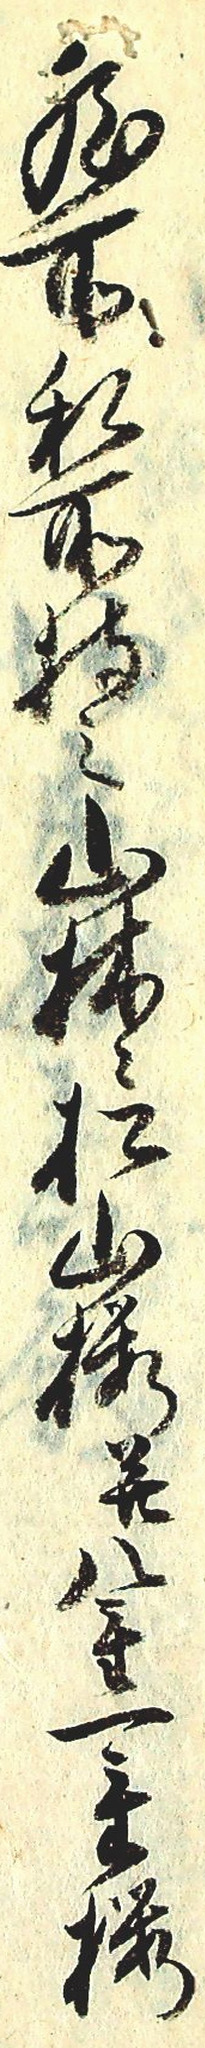然所私所持之山林に松山桜并八重一重桜
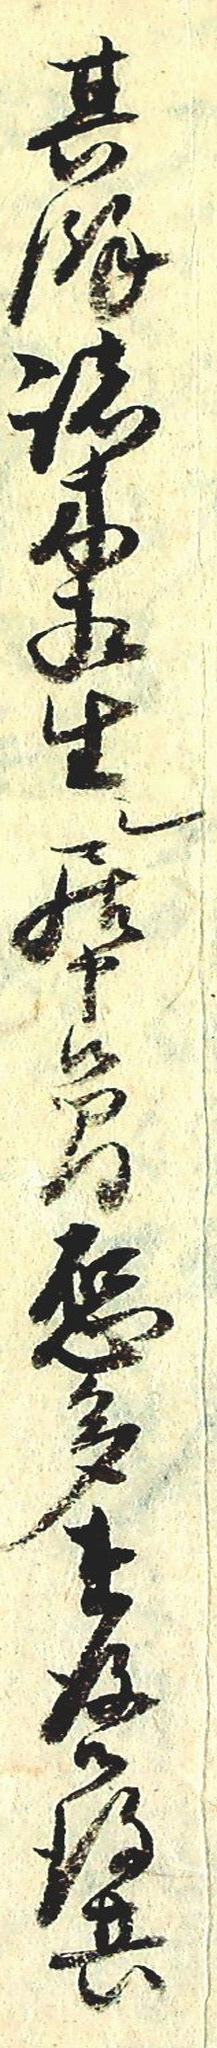其余諸木相生し居申候間恐多奉存候得共
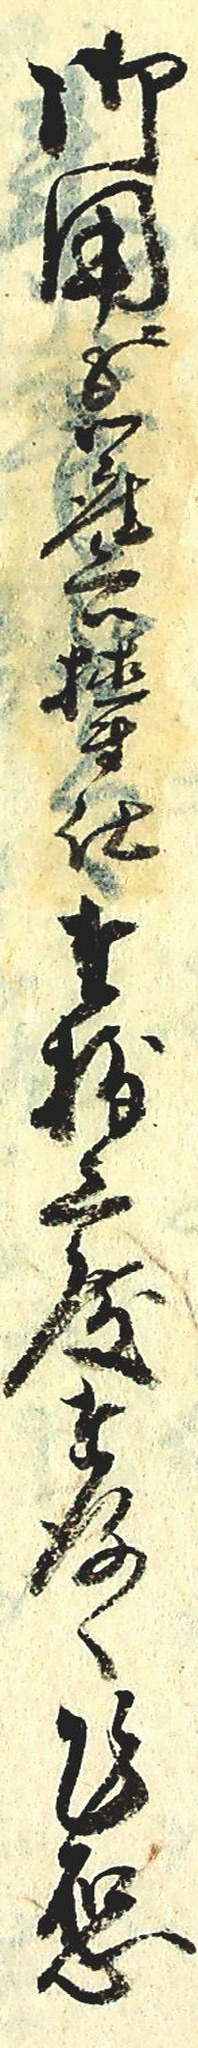御用にも御座候はゝ植付仕奉指上度奉存候乍恐
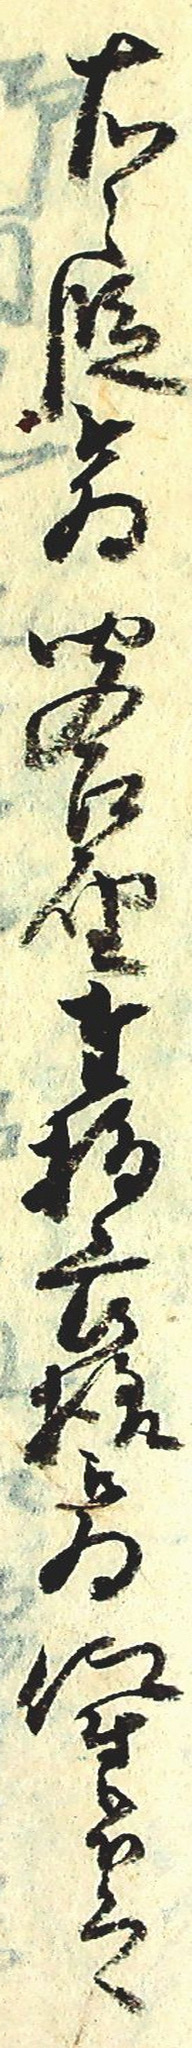右之段被為聞召届奉指上候様被為仰付被下候はゝ
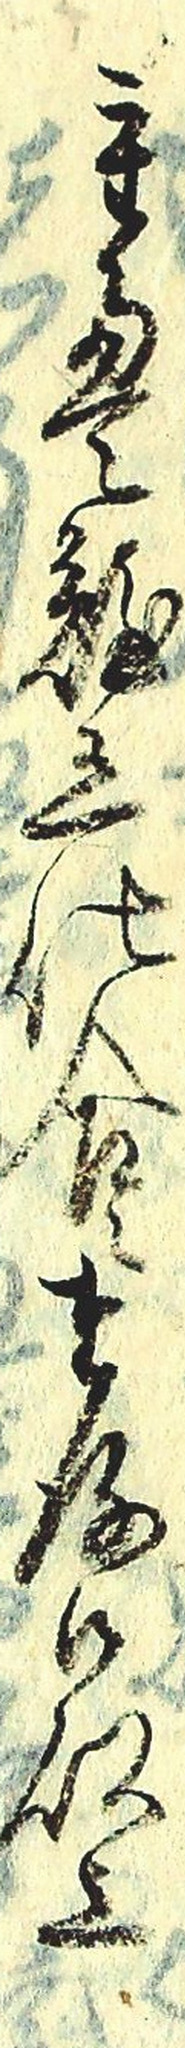重畳難有仕合に奉存候以上
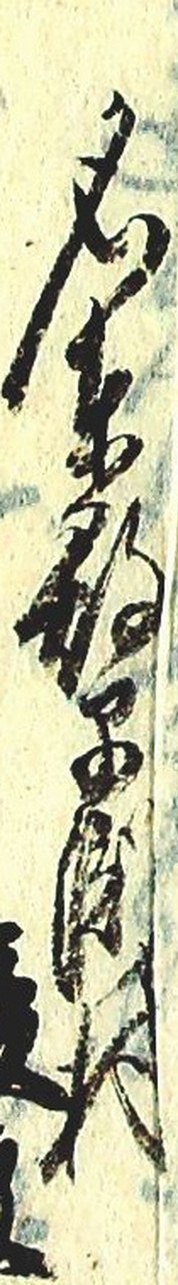名東郡早淵村
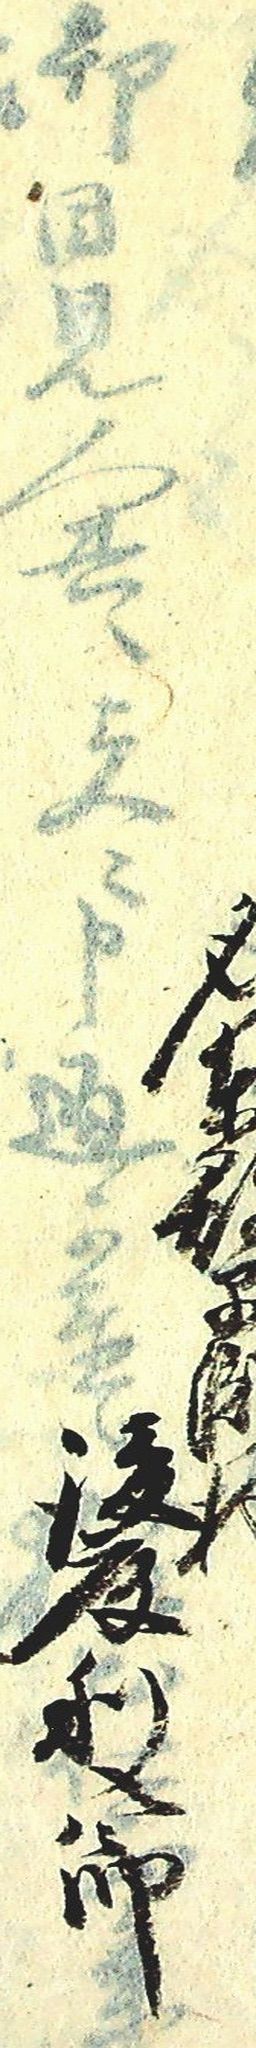後藤利八郎
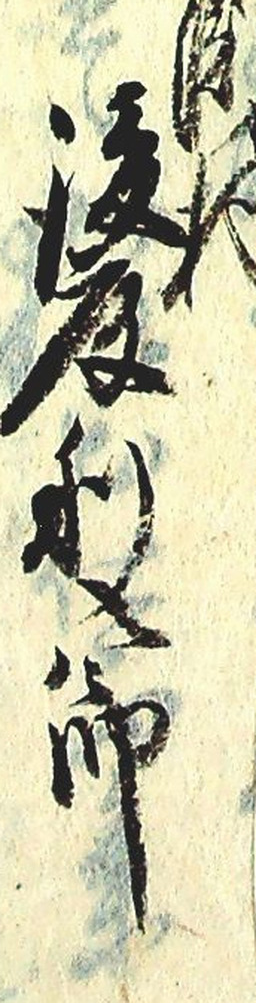後藤利八郎
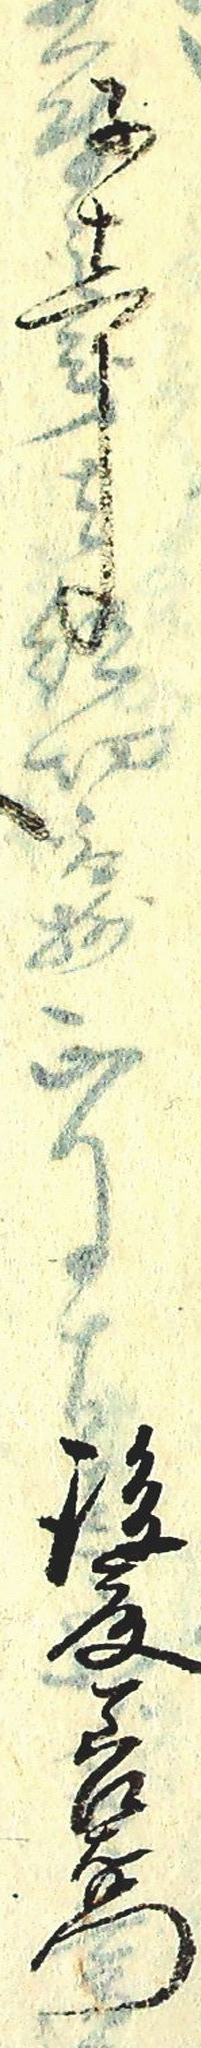子十二月後藤善右衛門
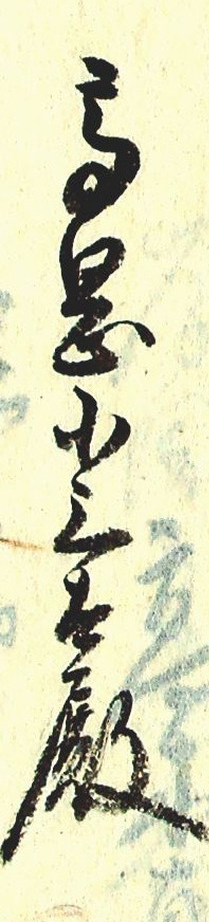高岡小三太殿

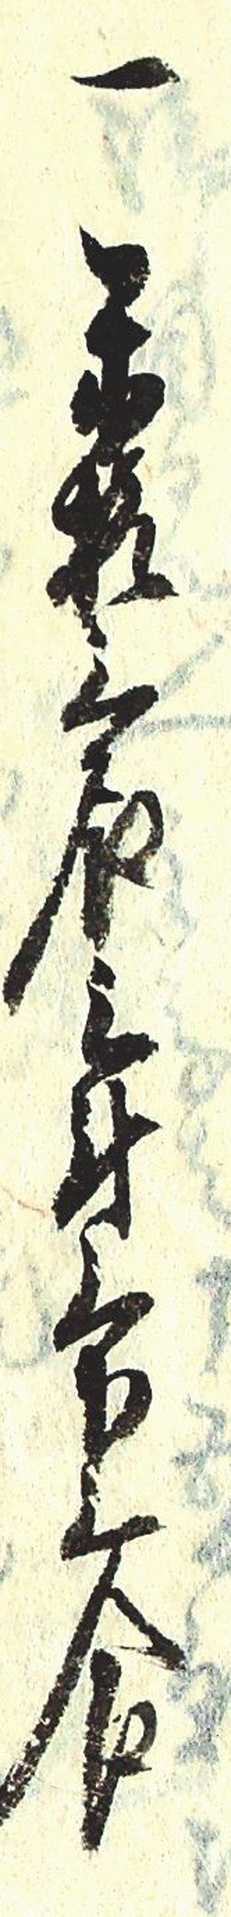一米拾三石三斗三升三合
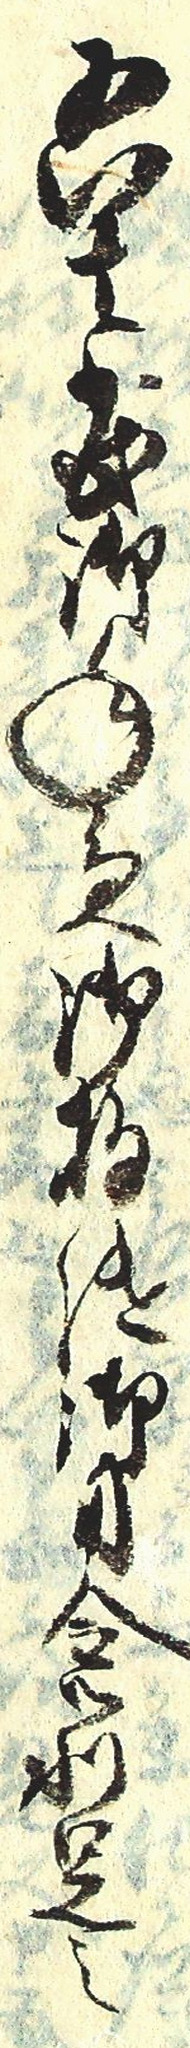右は当御年貢御指継御用金利足之
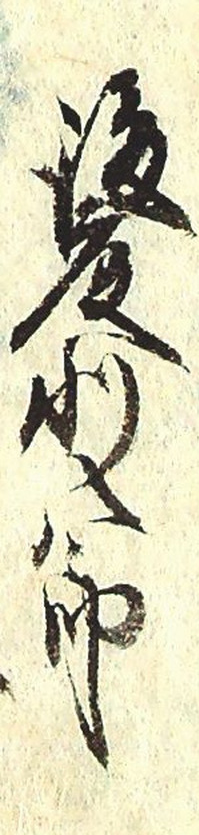後藤利八郎
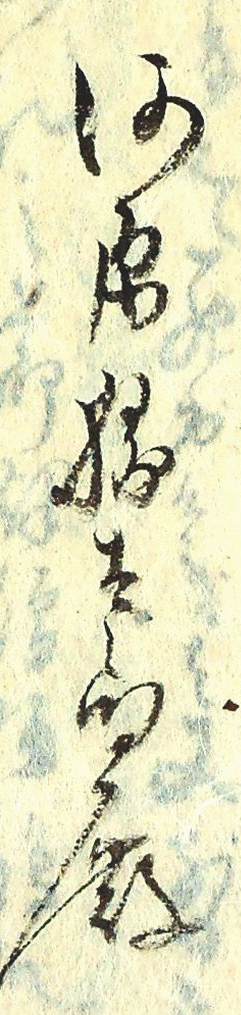河原勝太郎殿
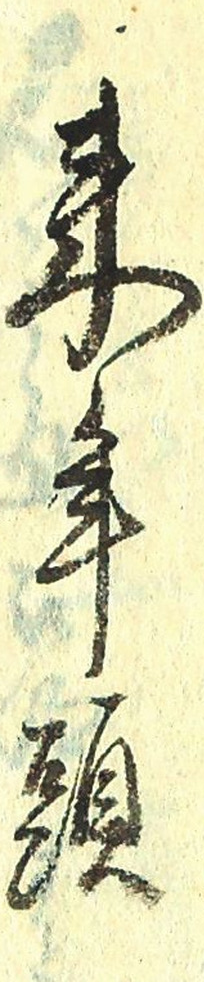来年頭
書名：諸御願書控(弐番）
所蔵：鳴門教育大学 Naruto University of Education
